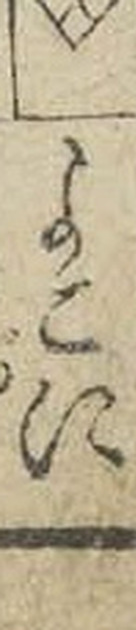よこに
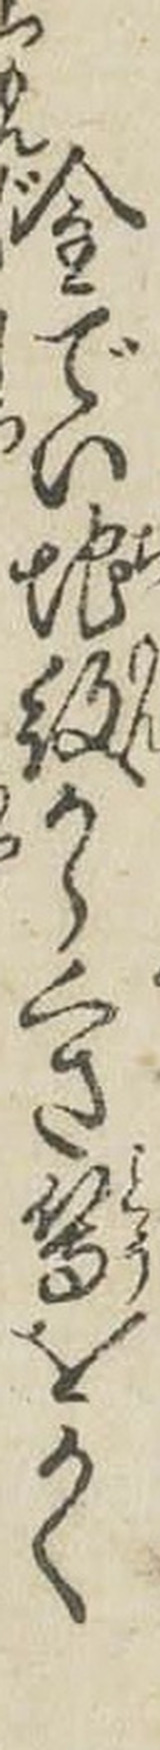金でい地紋からくさ等をかく
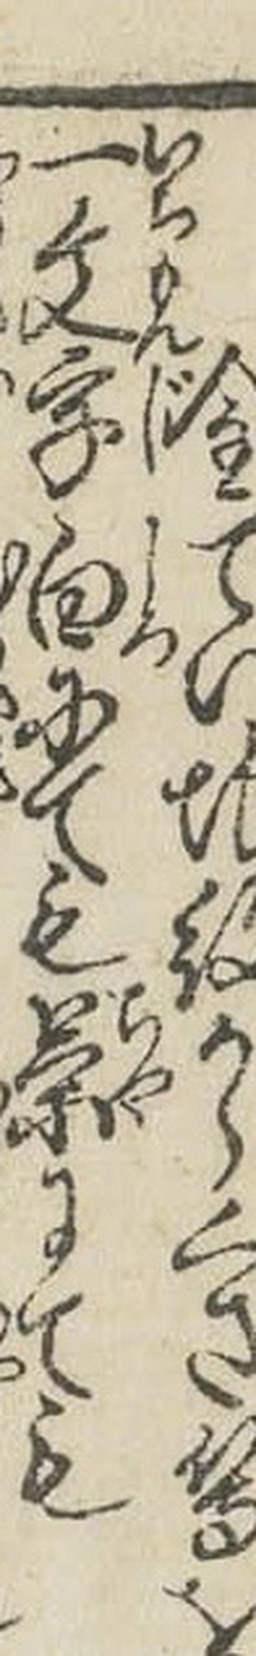一文字白にても茶にても
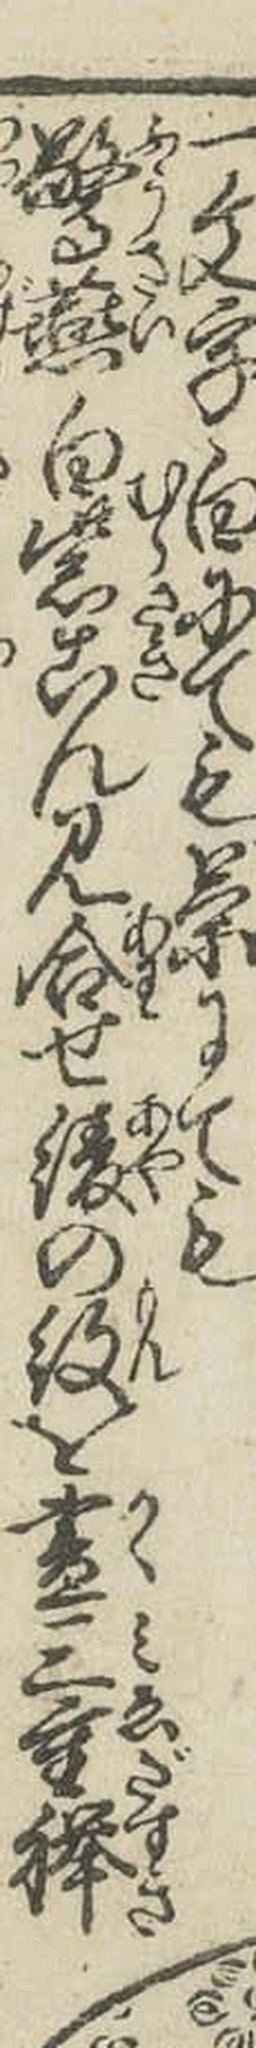驚燕白紫こん見合せ綾の紋を画三重襷
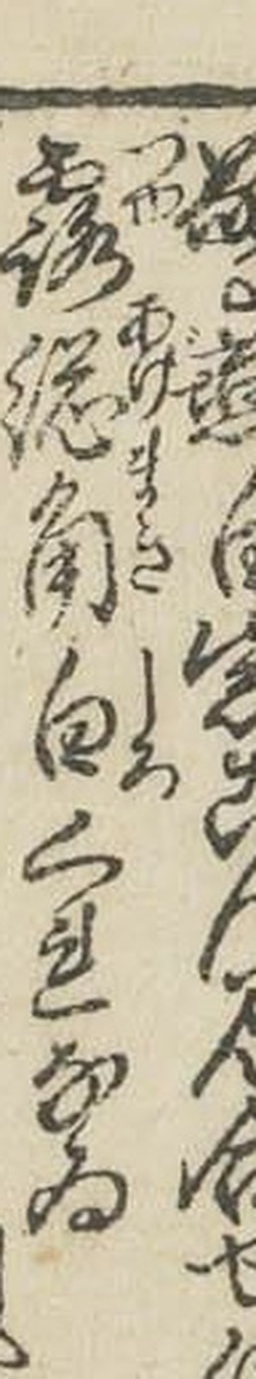露総角白くれなゐ
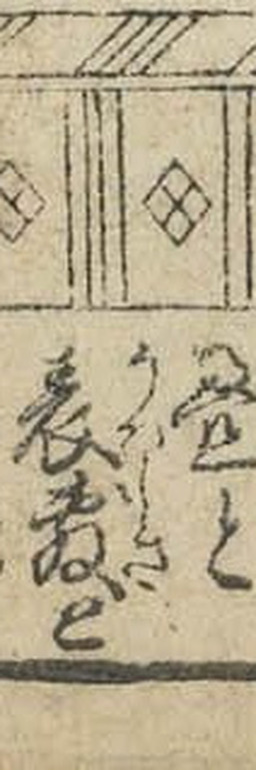表敷と
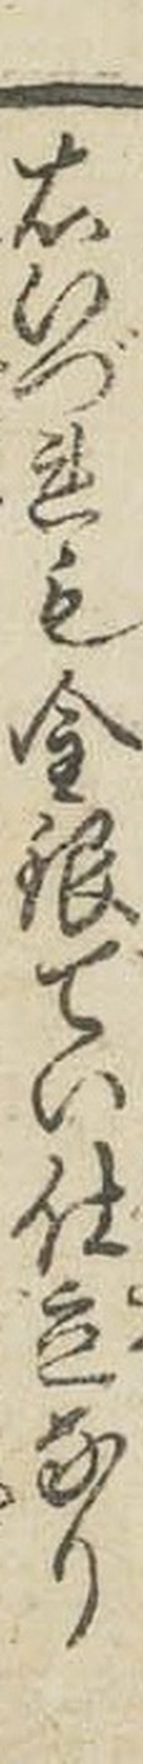右いづれも金銀でい仕立なり
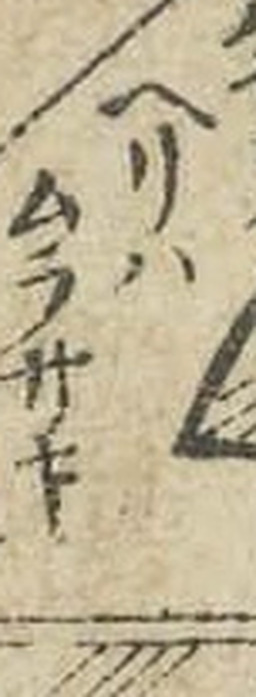ムラサキ
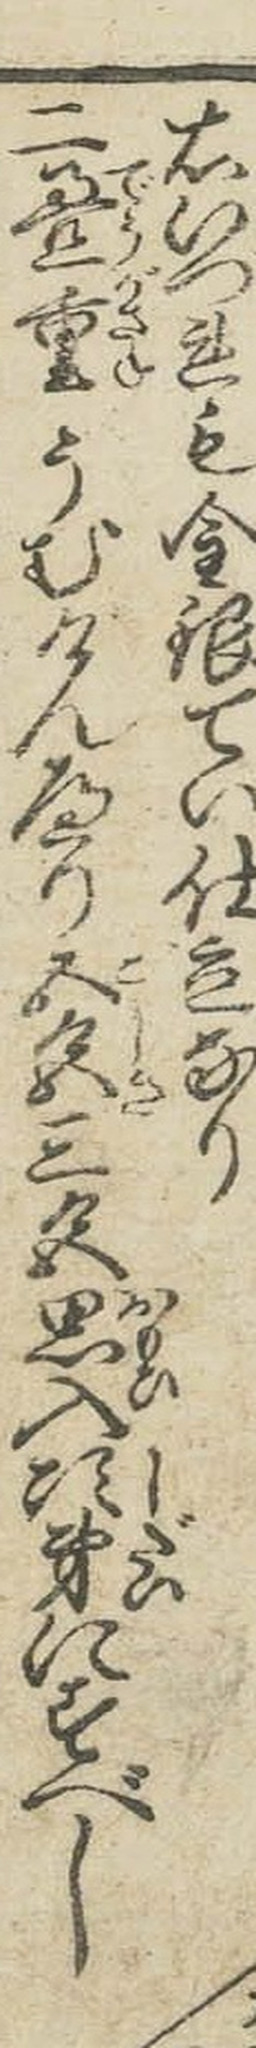二畳重うむけんへり五色三色思入次第にすべし
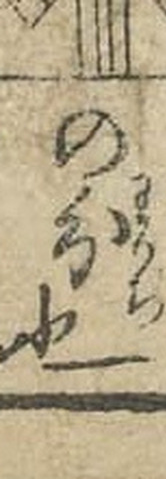の分也
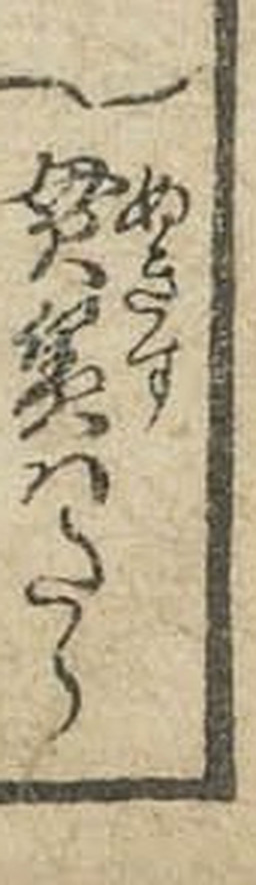貫簀はたら
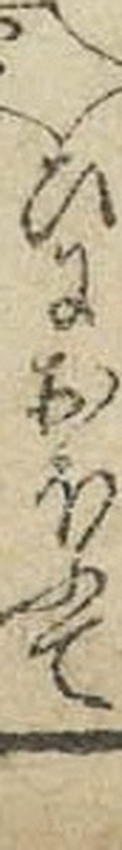ひにおほふて
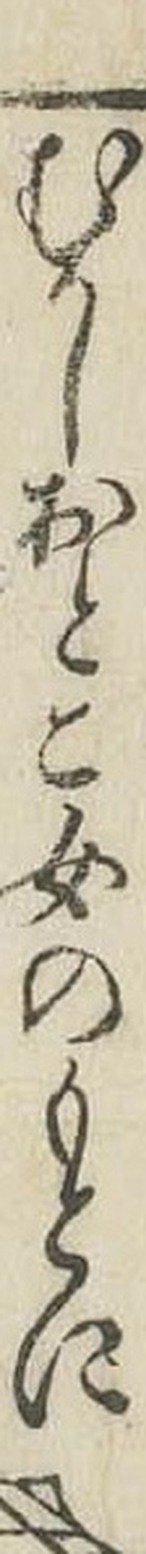むかしおとこ女のもとに
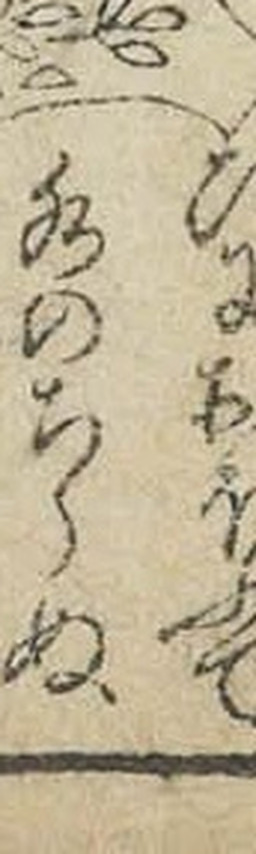水のちらぬ
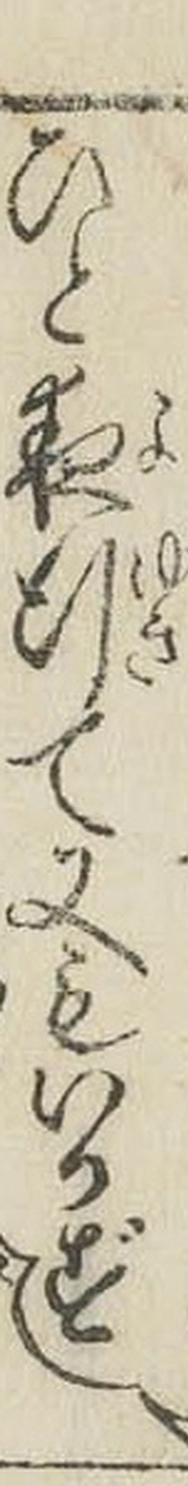ひと夜行て又もいかず
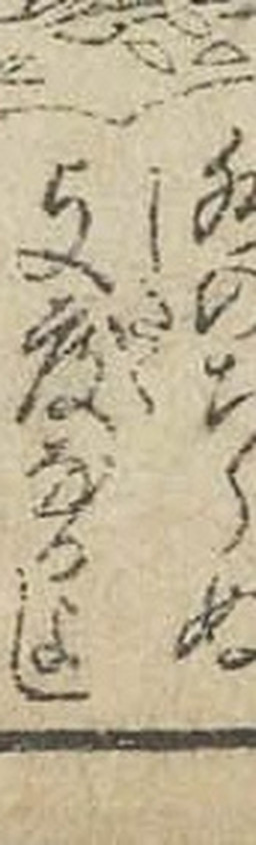支度なるよし
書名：絵本写宝袋 9巻 1之巻
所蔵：東京学芸大学教育コンテンツアーカイブ
